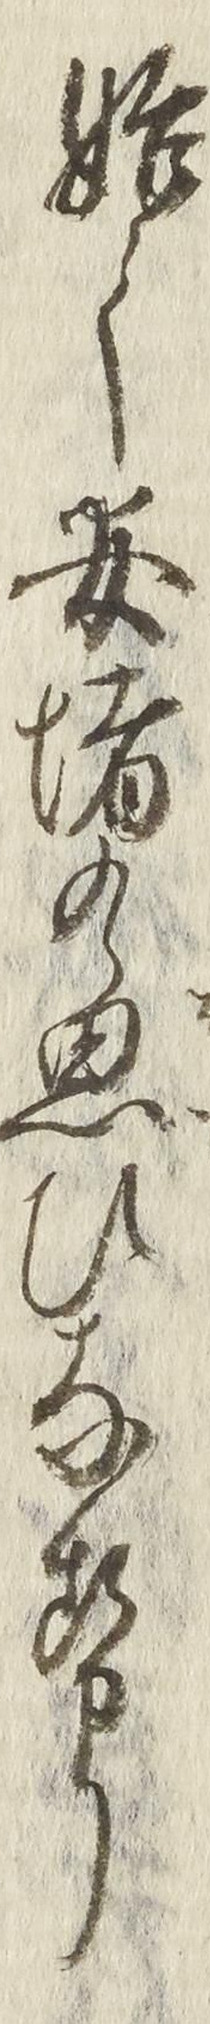始て安堵の思ひなせり
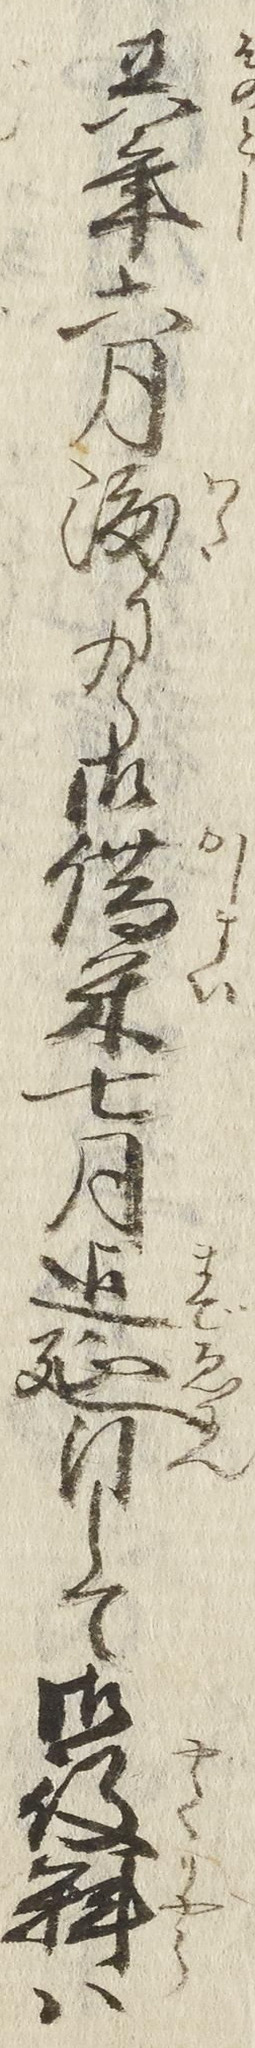其年六月渡りの御借米七月迄延引して御役料は
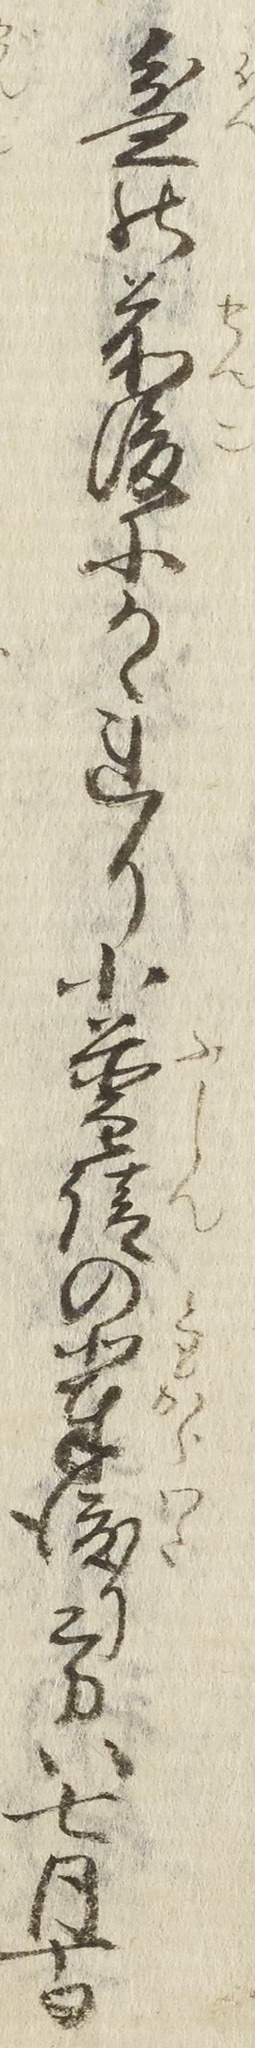盆の前後にかゝれり小普請の輩渡り方は七月十日
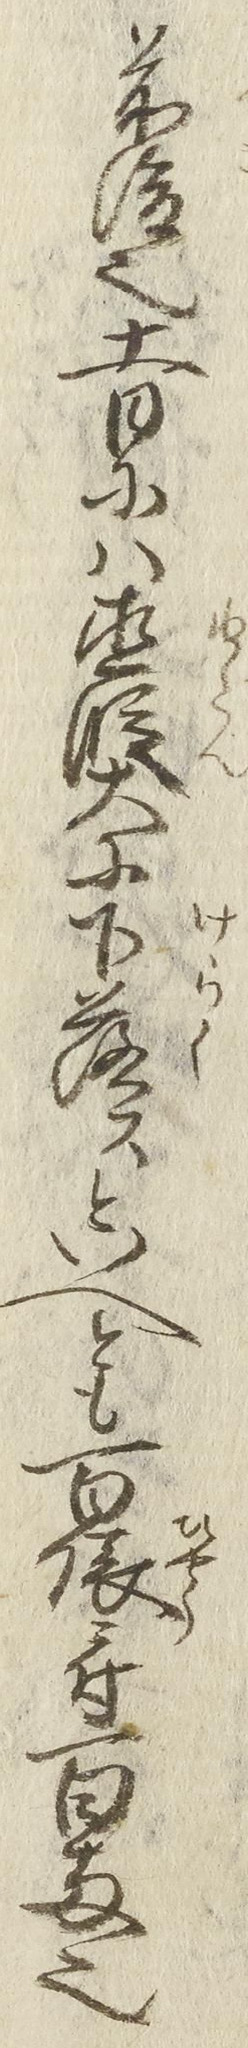前後也十一日には直段大に下落スといへとも百俵ニ付百両也
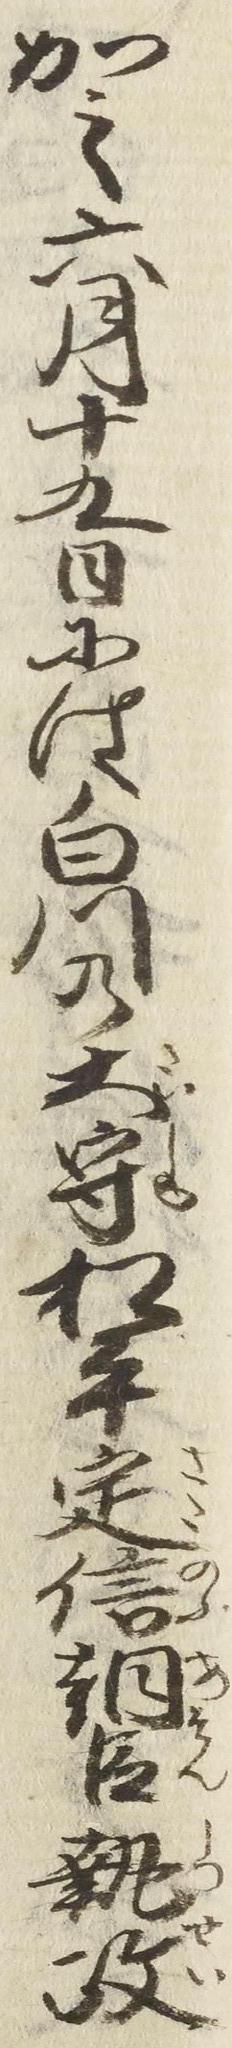加之六月十九日には白川の大守松平定信朝臣執政
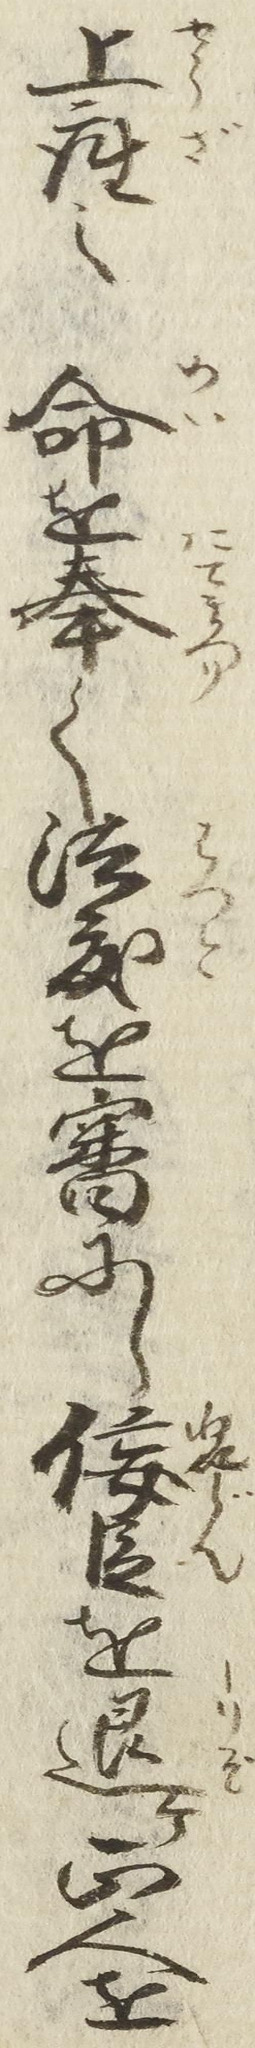上座之命を奉て法度を審にし佞臣を退ケ正人を
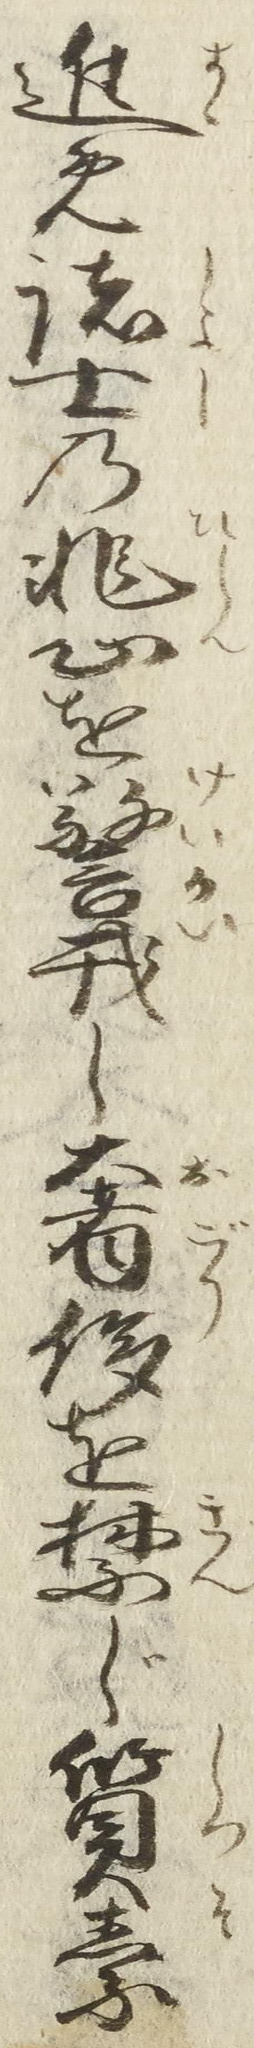進め諸士の非心を警戒し奢侈を禁じ質素
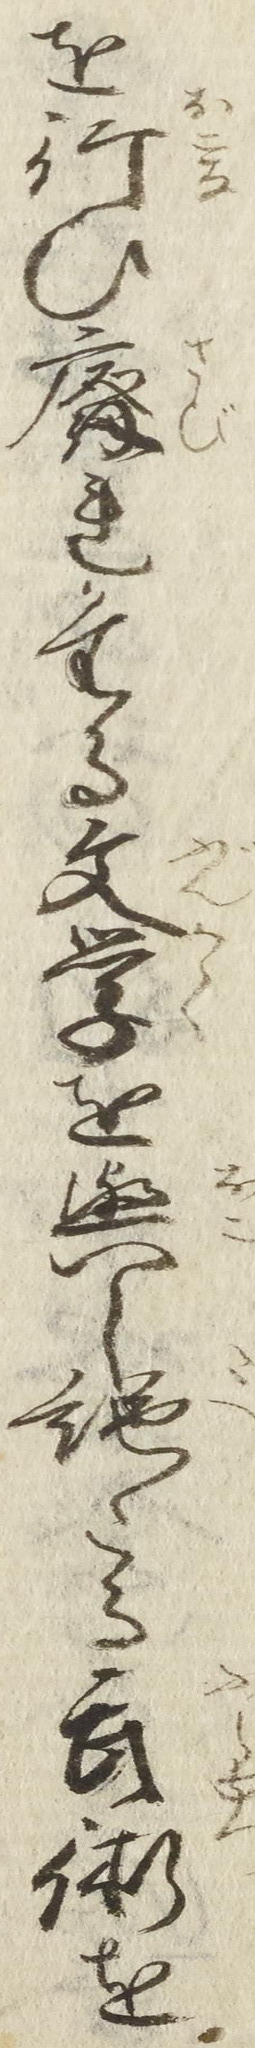を行ひ廃れたる文学を興し絶たる武術を
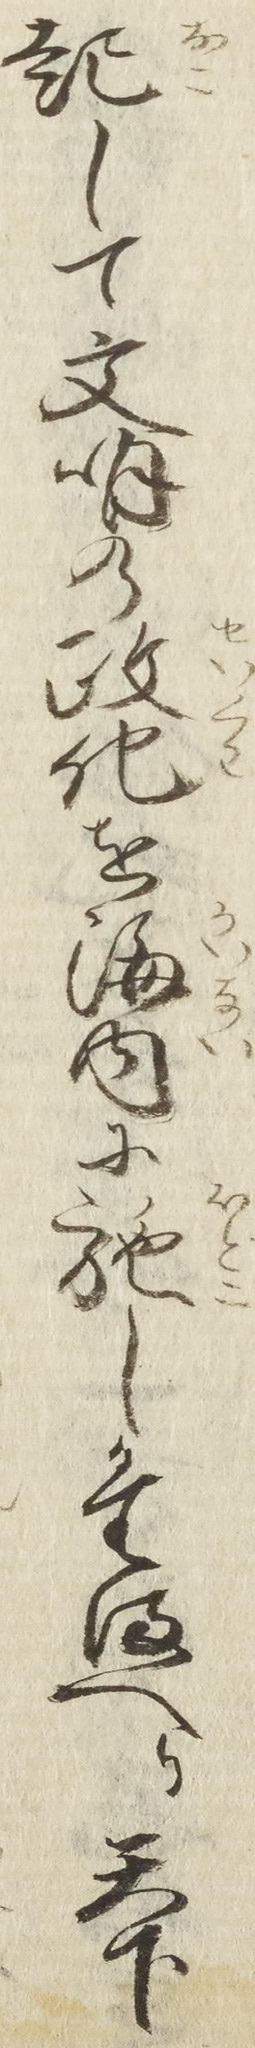起して文明の政化を海内に施したまへり天下
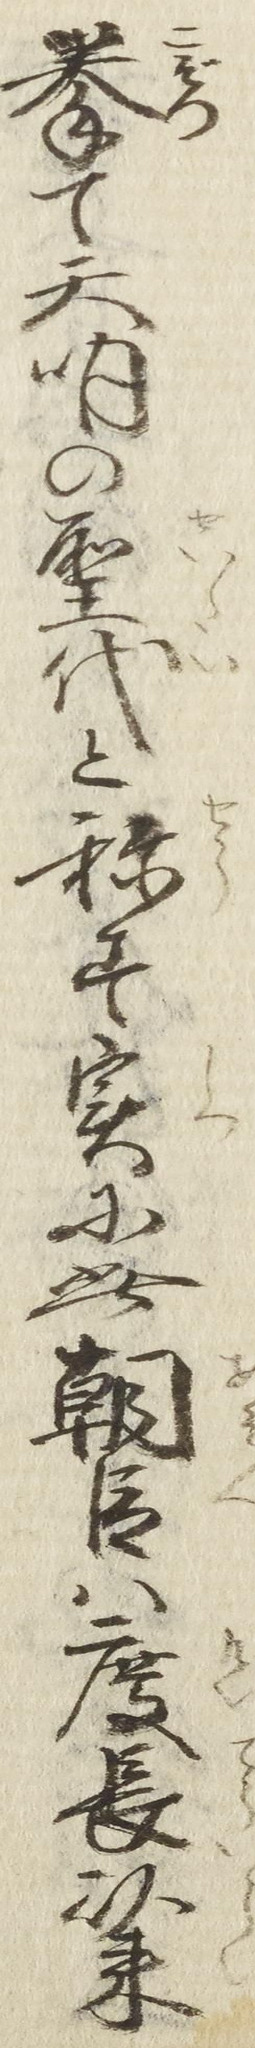挙て天明の聖代と称す実に此朝臣は慶長以来
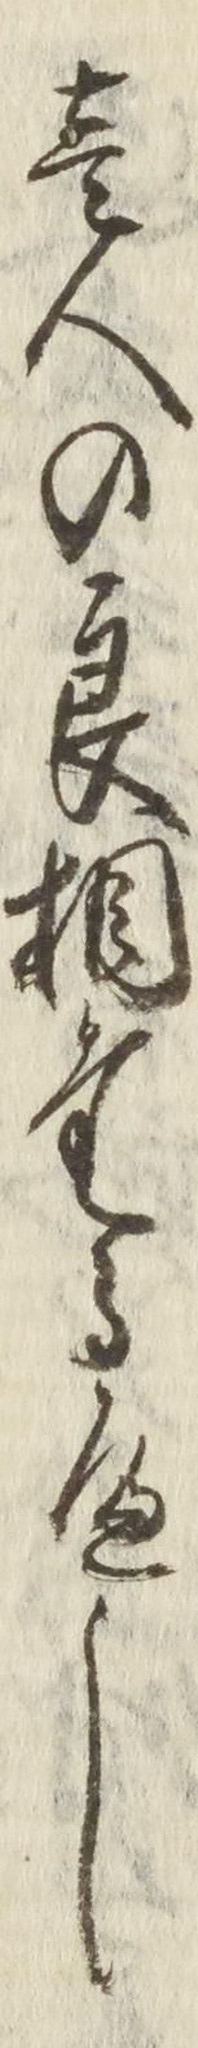壱人の良相たるへし

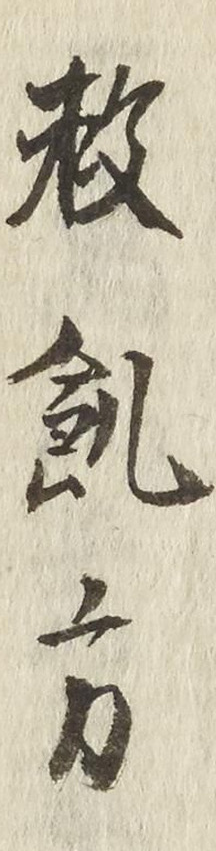救飢方
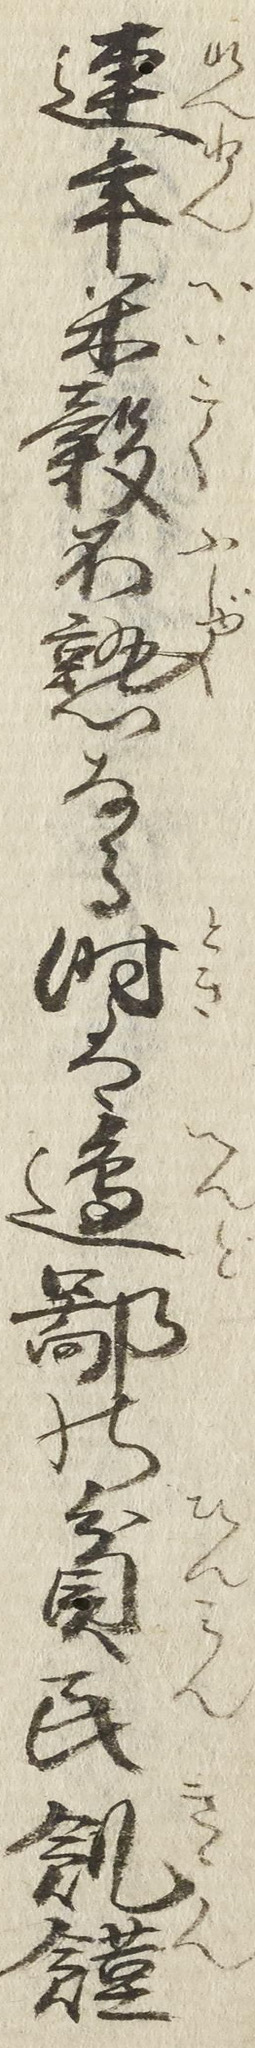連年米穀不熟なる時は辺鄙の貧民飢饉
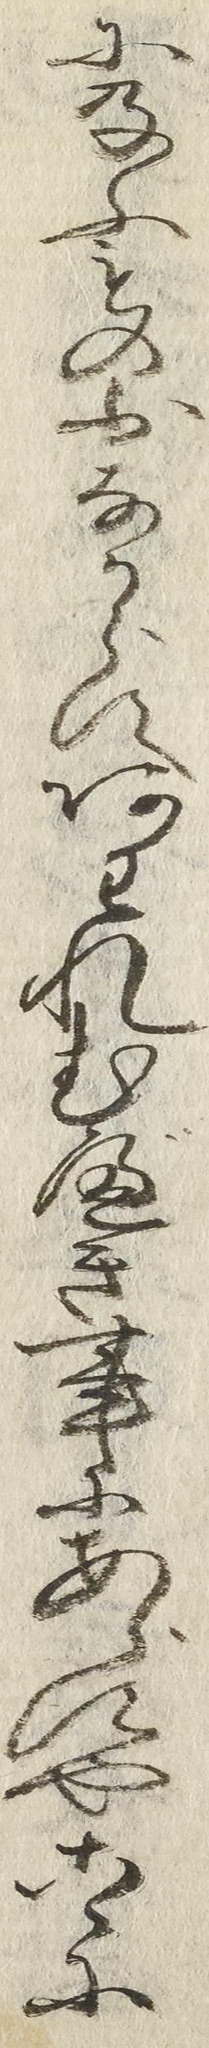に及ふもの少なからすあわれむべき事にあらすやこゝに
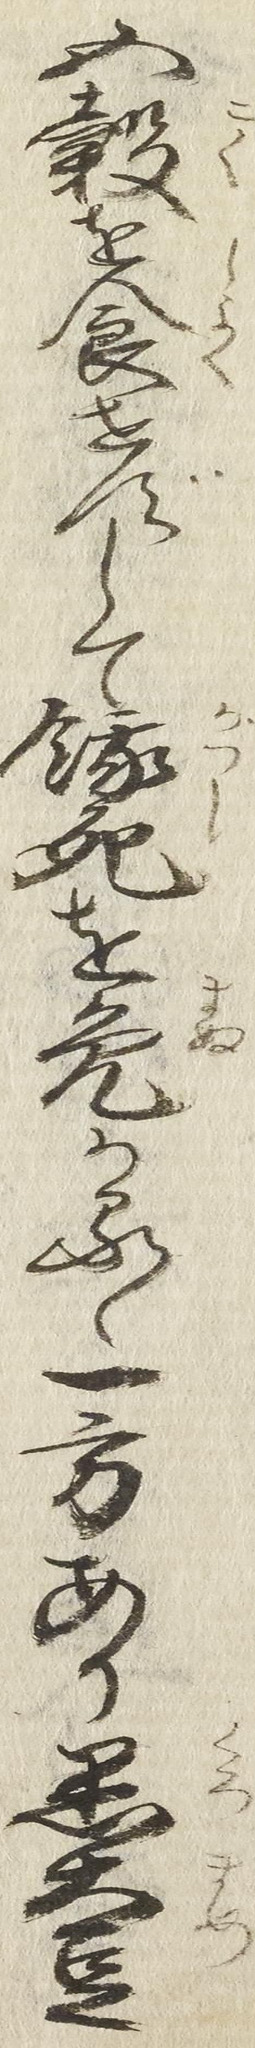五穀を食せずして餓死を免かるゝ一方あり黒大豆
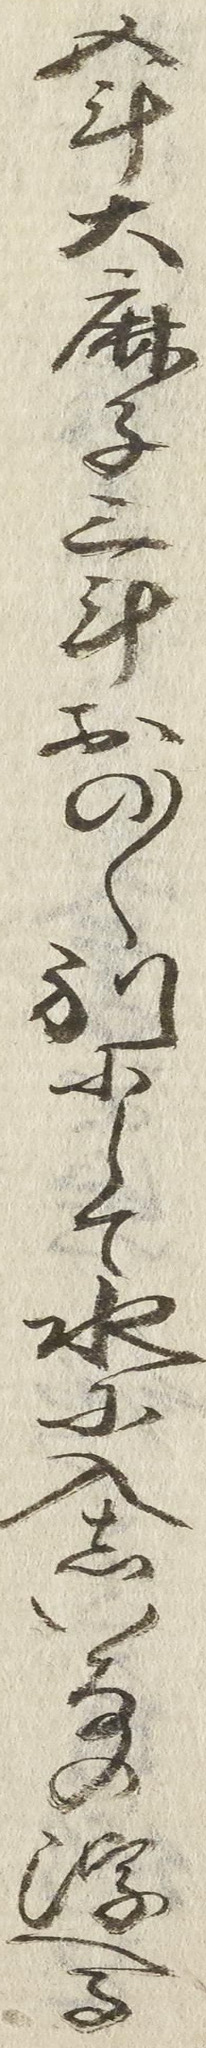五斗大麻子三斗おの〳〵別にして水に入しいなの浮へる
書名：天明奇畧　全
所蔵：東京大学地震研究所図書室 Earthquake Research Institute Library, The University of Tokyo, JAPAN
